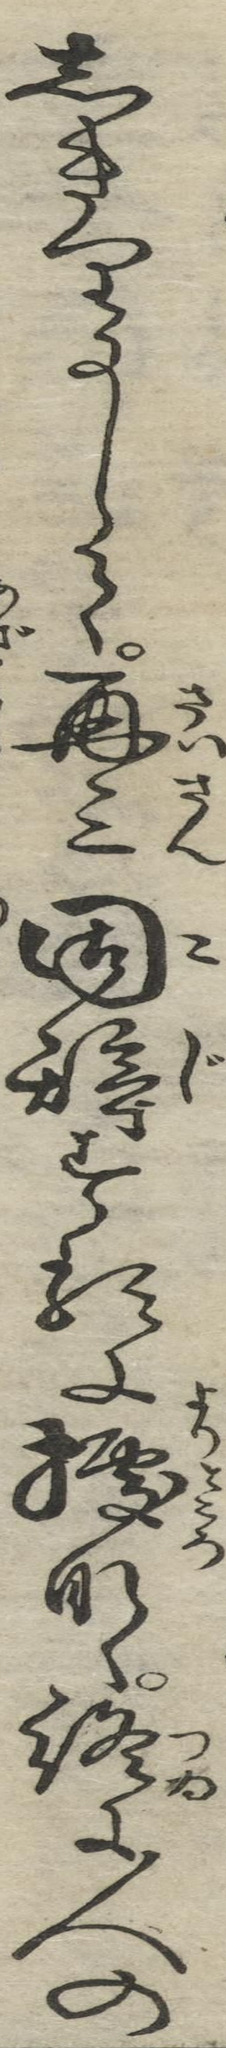しきりにして。再三固辞するに拠なく。終に人の
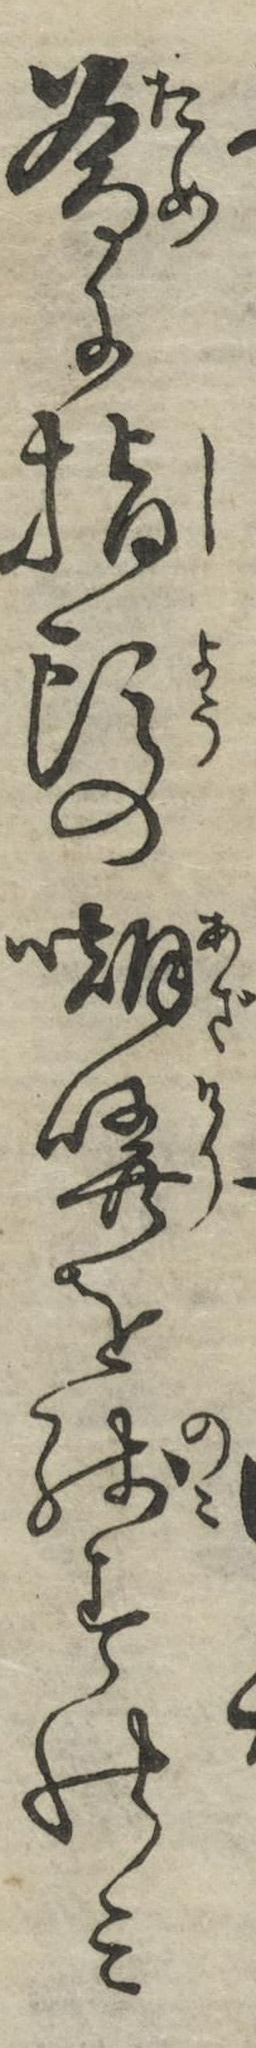為に指頭の嘲哢を残すのみ
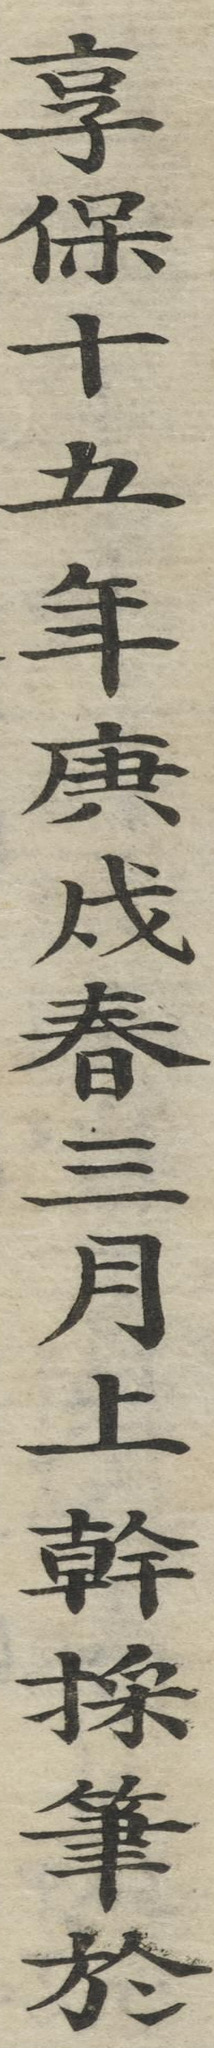享保十五年庚戌春三月上幹採筆於
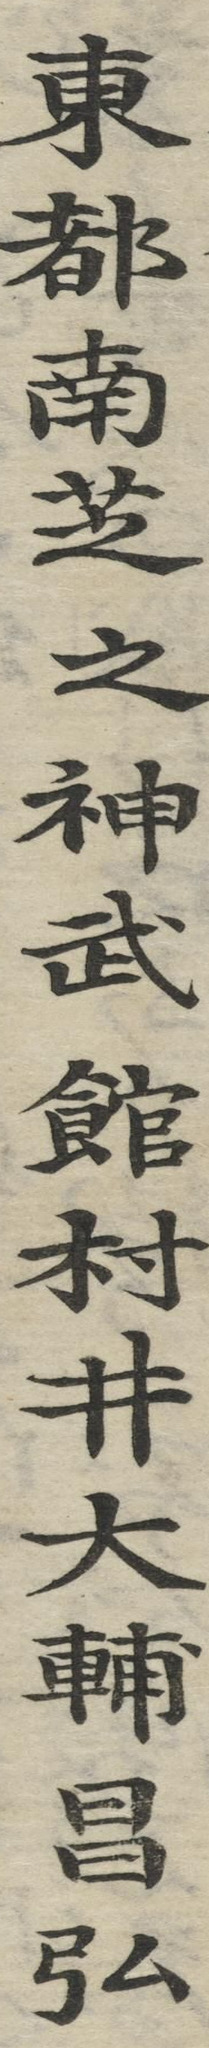東都南芝之神武館村井大輔昌弘
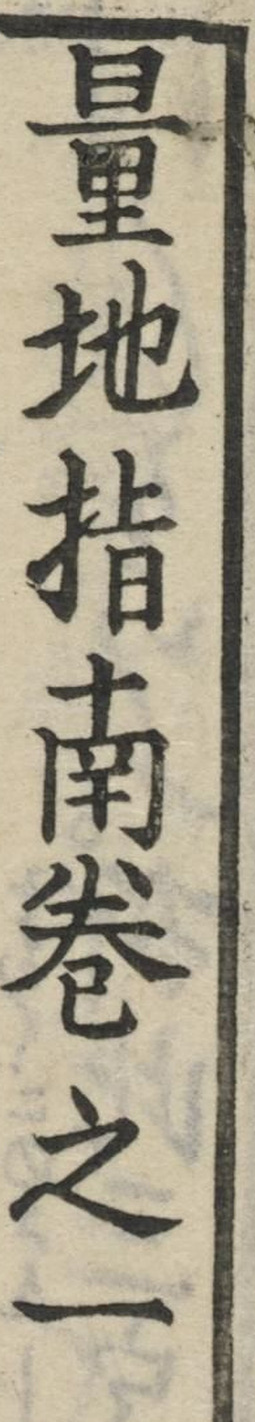量地指南巻之一
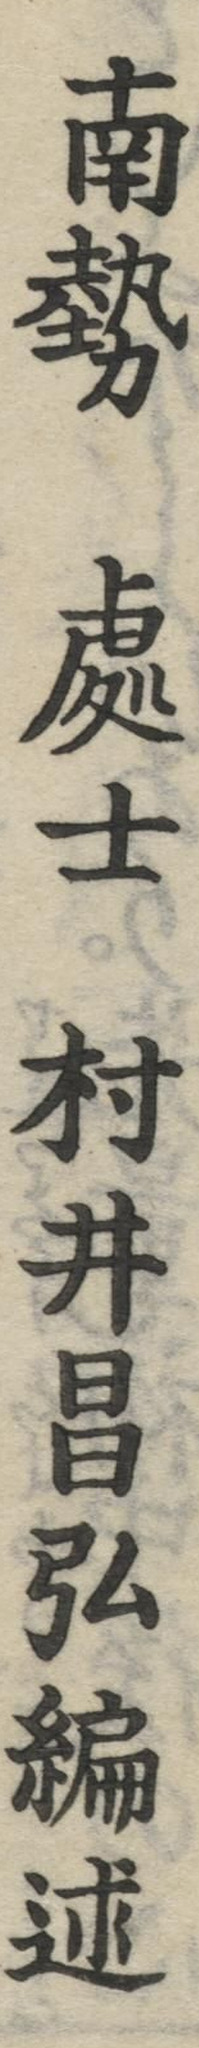南勢処士村井昌弘編述
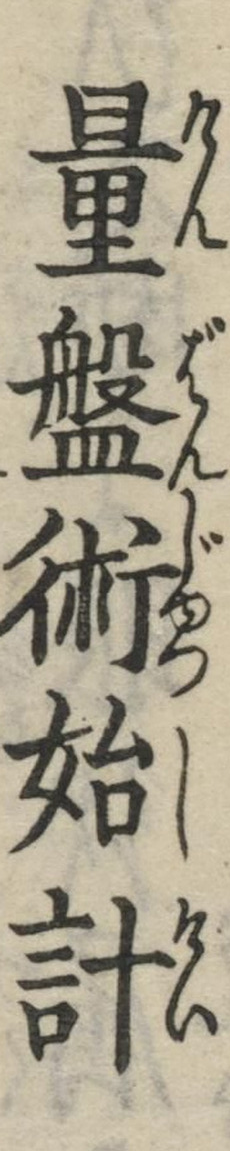量盤術始計
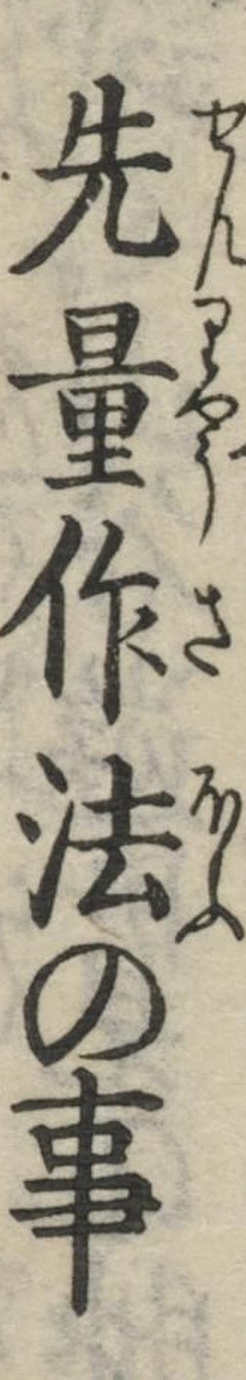先量作法の事
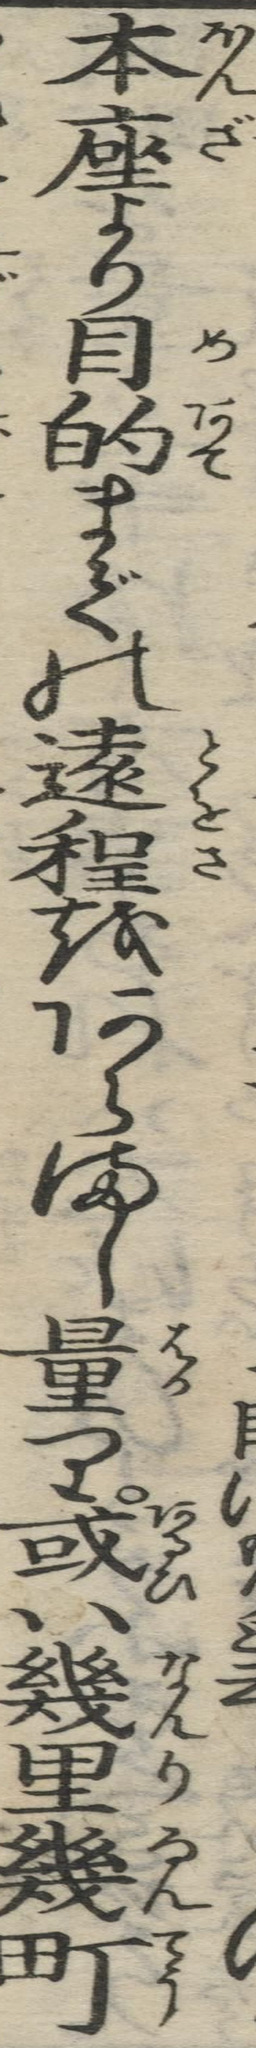本座より目的までの遠程をあらまし量り。或は幾里幾町
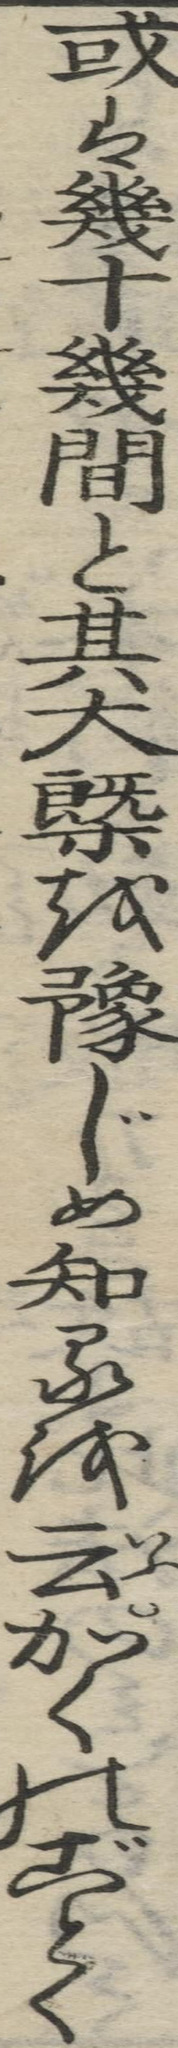或は幾十幾間と其大概を予め知るを云。かくのごとく
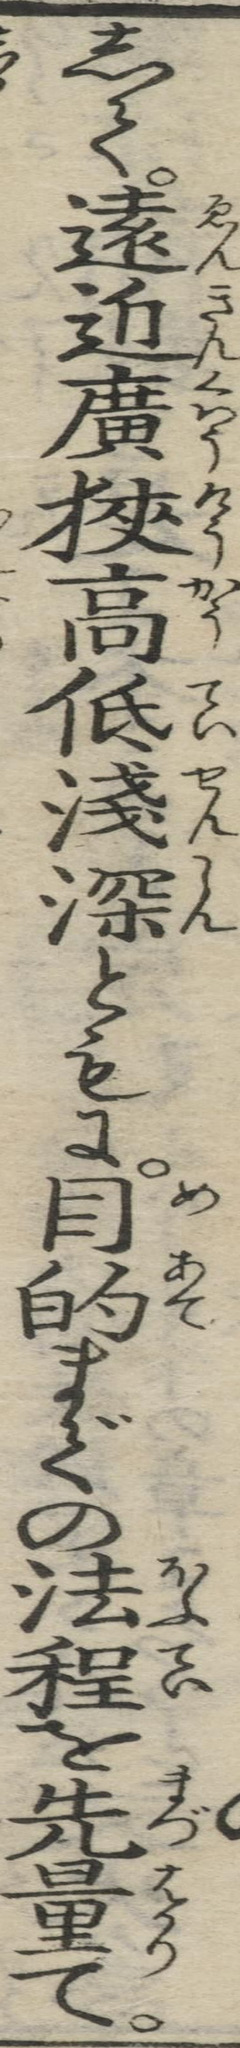して。遠近廣狭高低浅深ともに。目的までの法程を先量て。
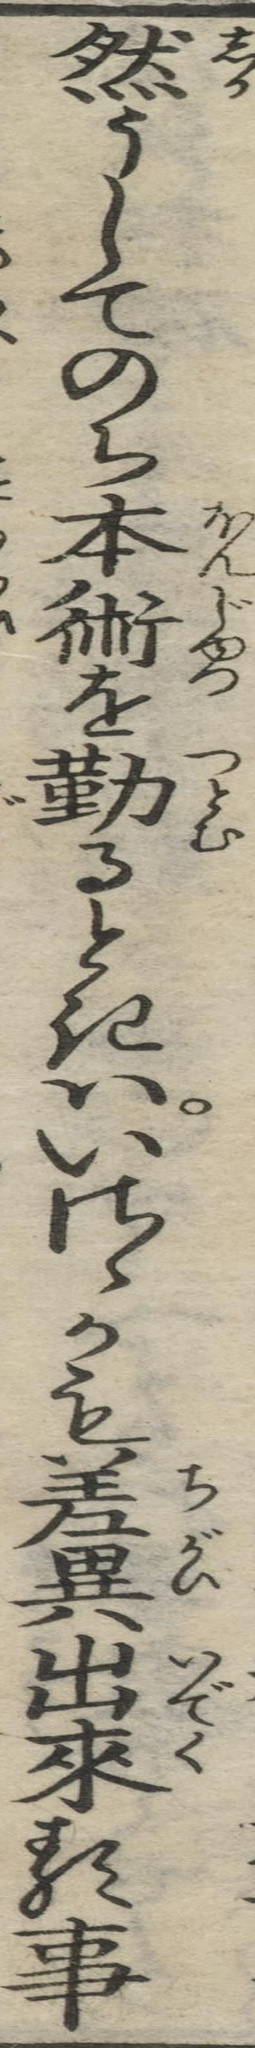然うしてのち本術を勤るときは。いさゝかも差異出来る事
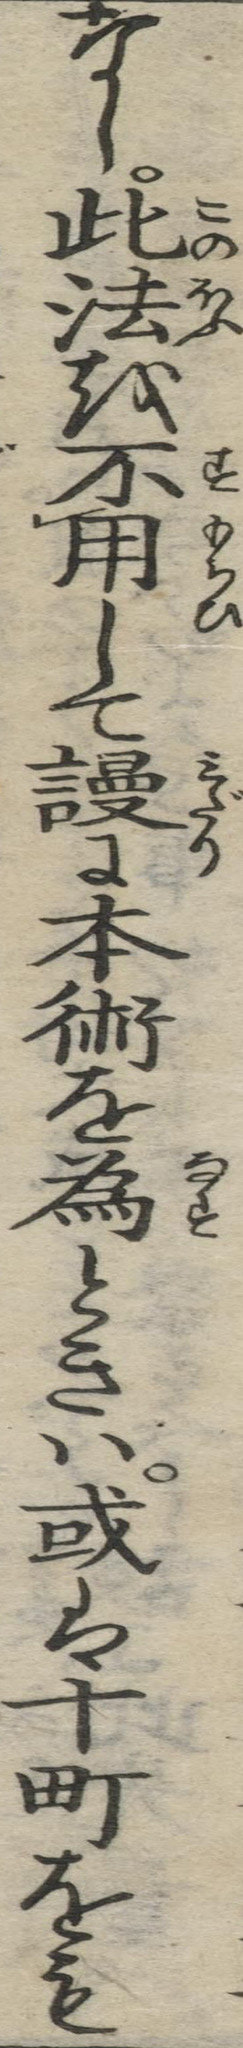なし。此法を不用して謾に本術を為ときは。或は十町をも
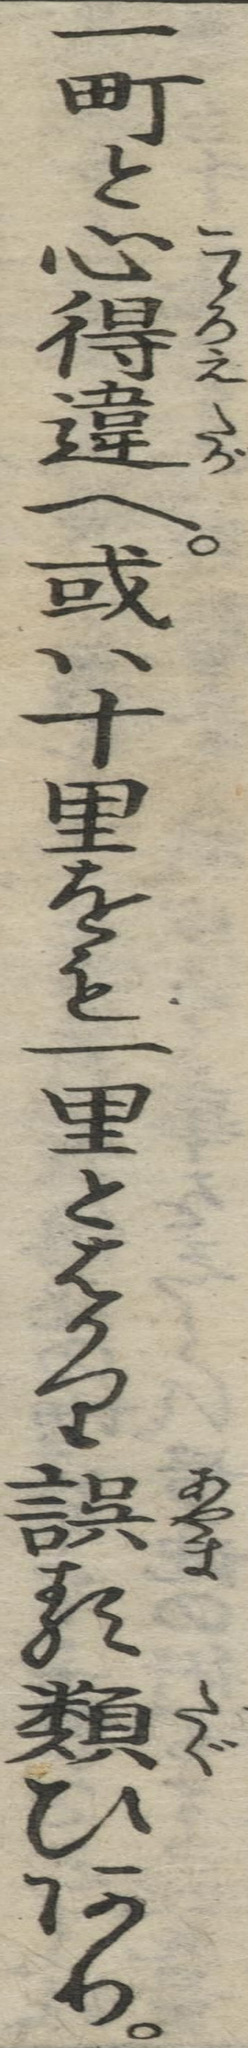一町と心得違へ。或は十里をも一里とはかり誤る類ひあり。

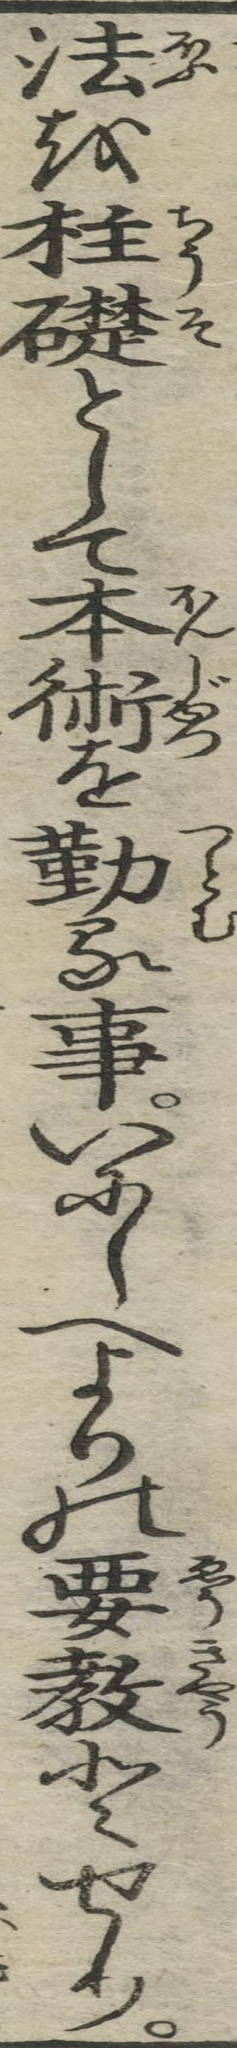法を柱礎として本術を勤る事。いにしへよりの要教とせり。
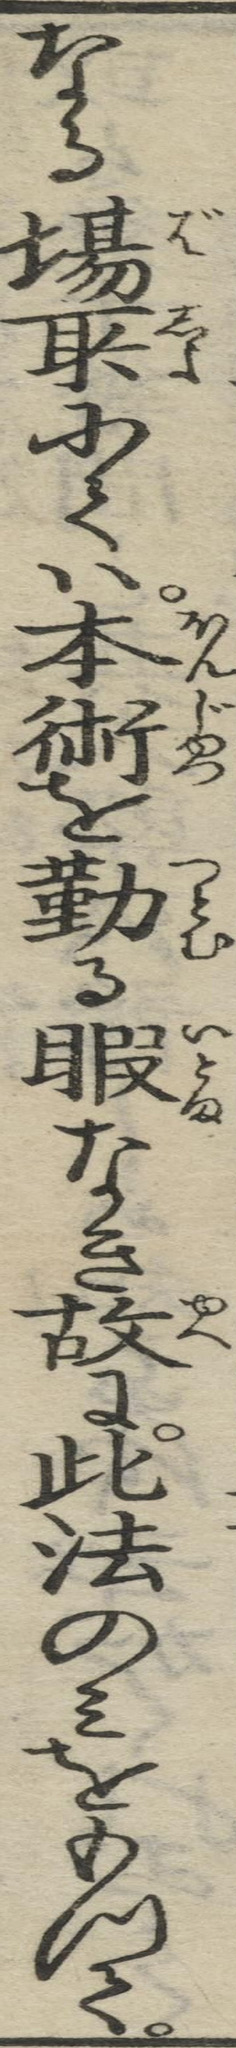なる場所にては。本術を勤る暇なき故に。此法のみをもつて。
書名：量地指南　巻之一（内題）
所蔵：東京大学地震研究所図書室 Earthquake Research Institute Library, The University of Tokyo, JAPAN
